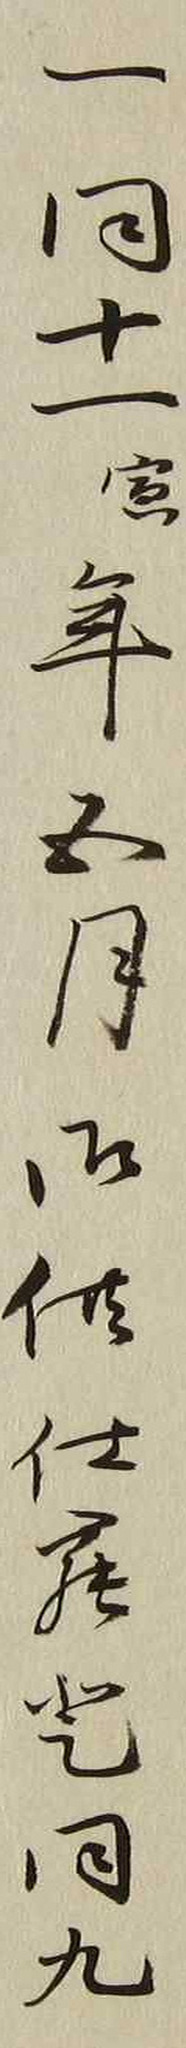一同十一寅年五月御供仕罷登同九
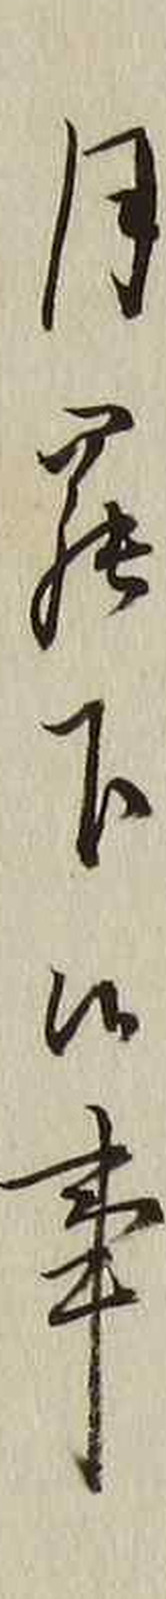月罷下候事
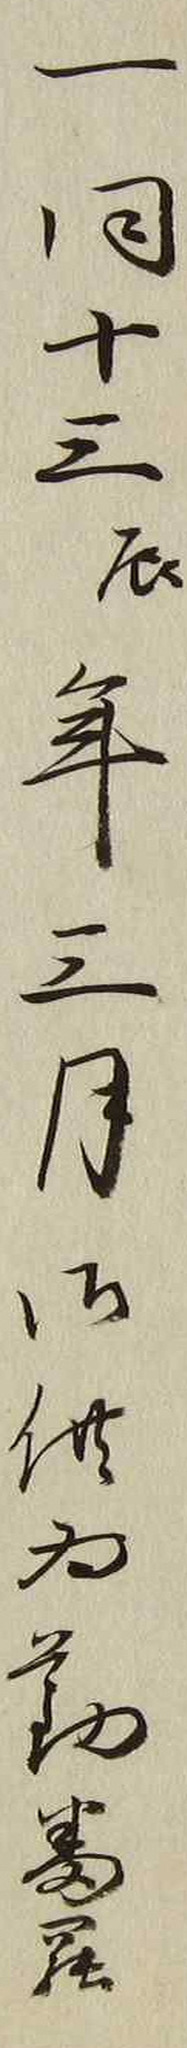一同十三辰年三月御供為勤番罷
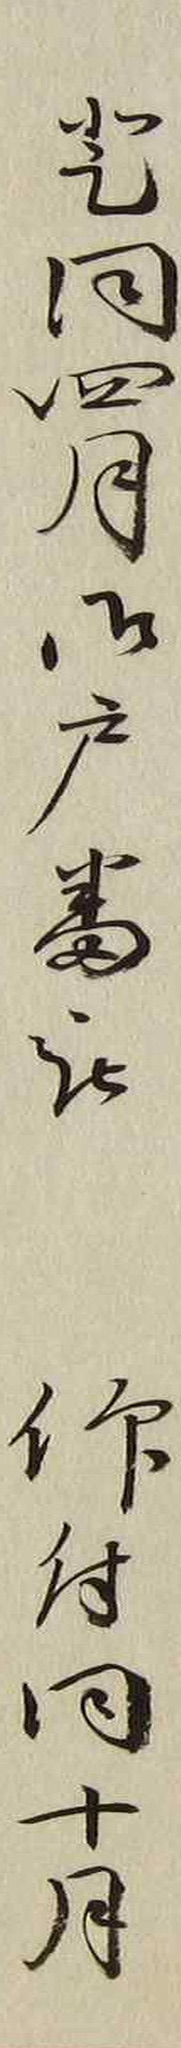登同四月御戸番被仰付同十月
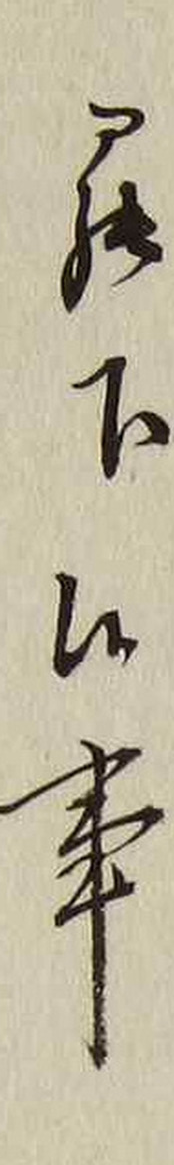罷下候事
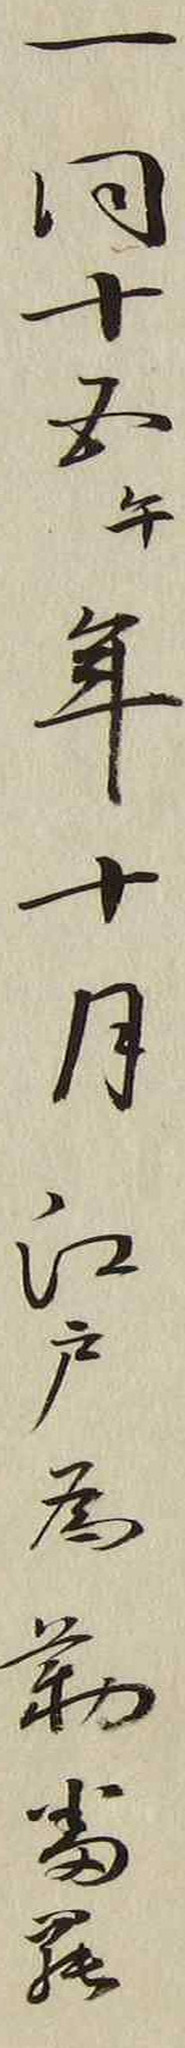一同十五午年十月江戸為勤番罷
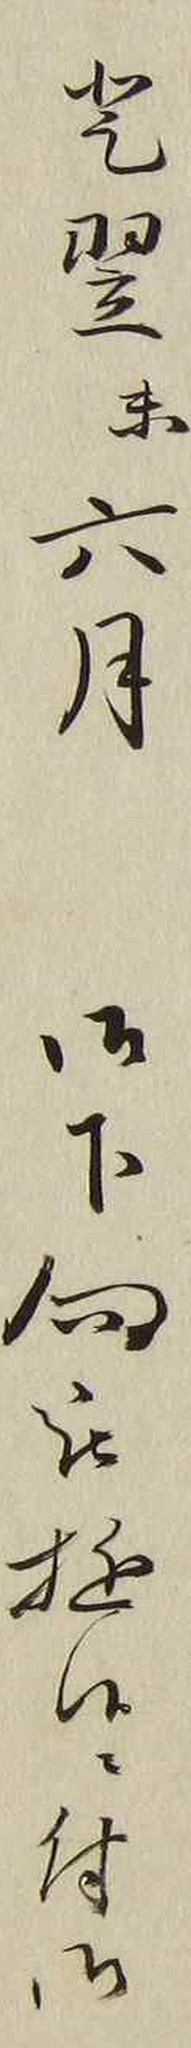登翌未六月御下向被遊候ニ付御

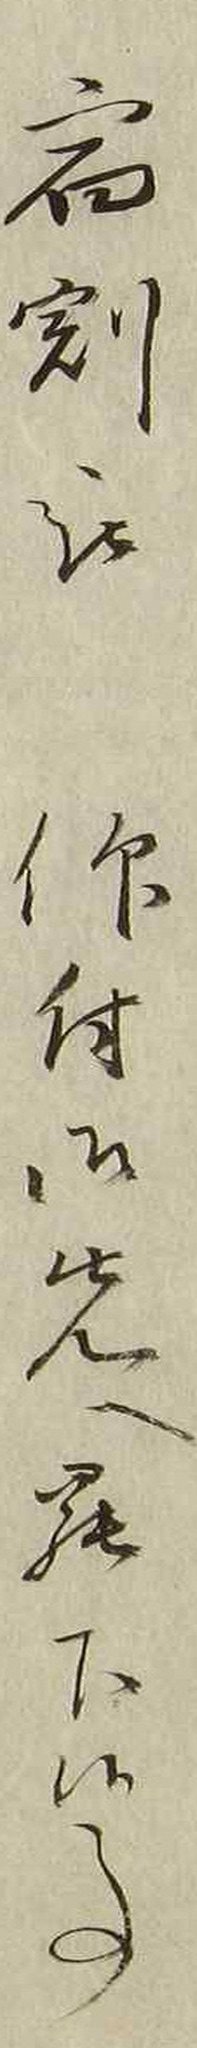宿割被仰付御先へ罷下候事
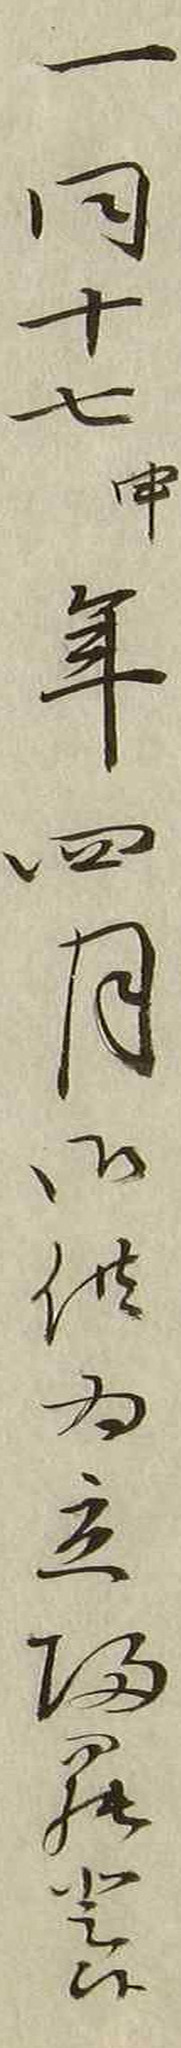一同十七申年四月御供為立帰罷登候
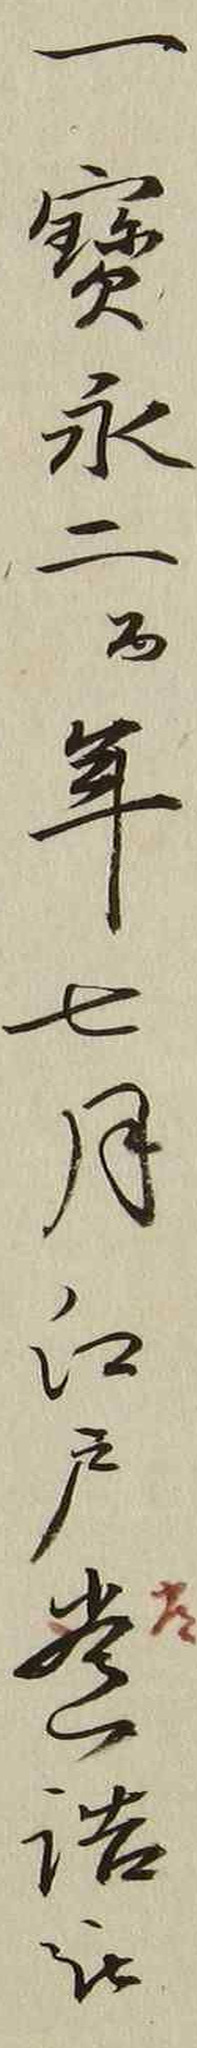一宝永二酉年七月江戸常詰被
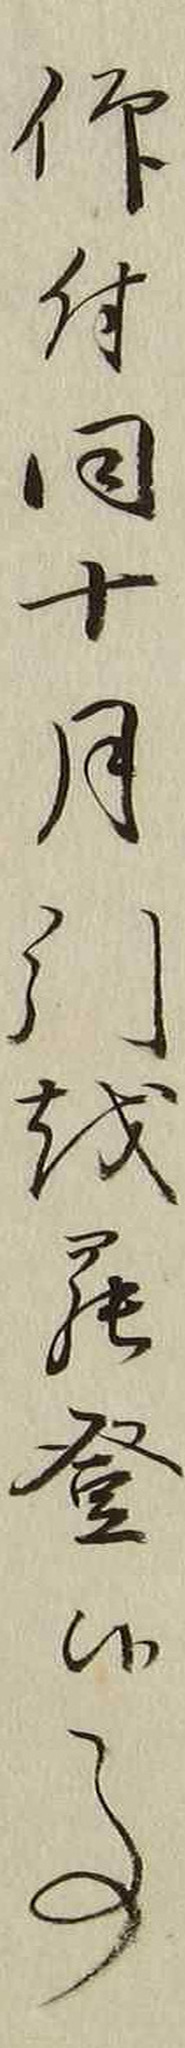仰付同十月引越罷登候事
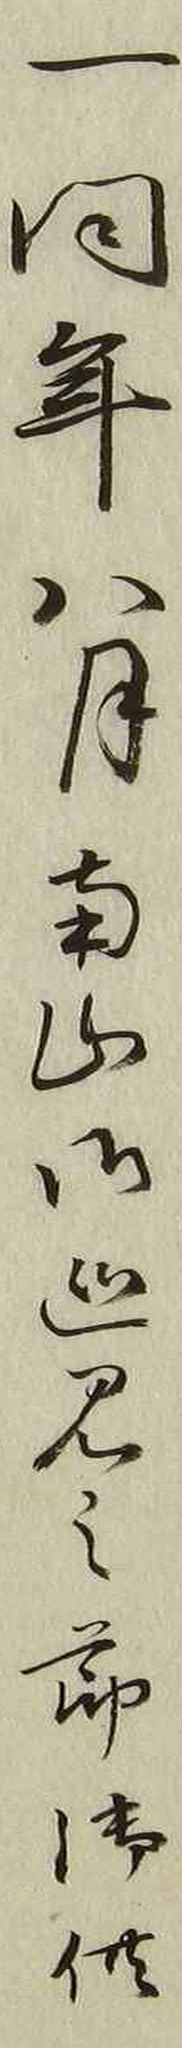一同年八月南山御巡見之節御供
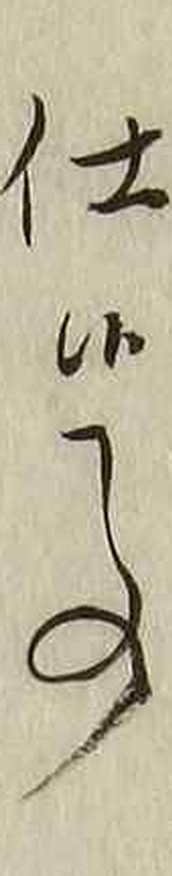仕候事
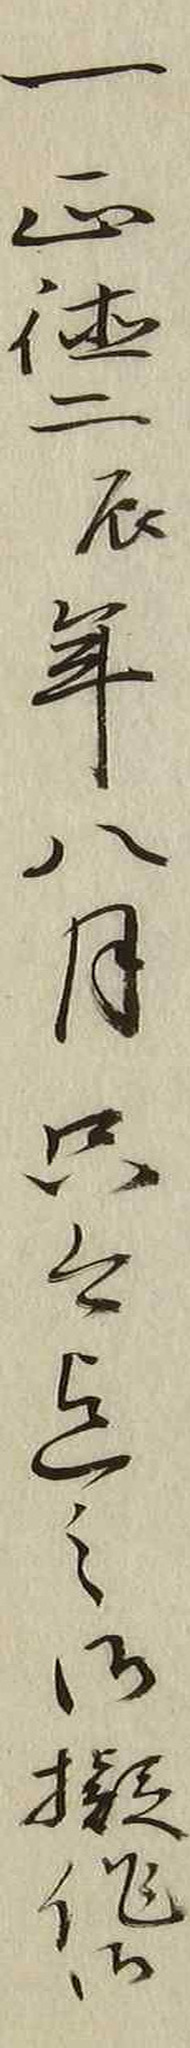一正徳二辰年八月只今迄之御擬作御
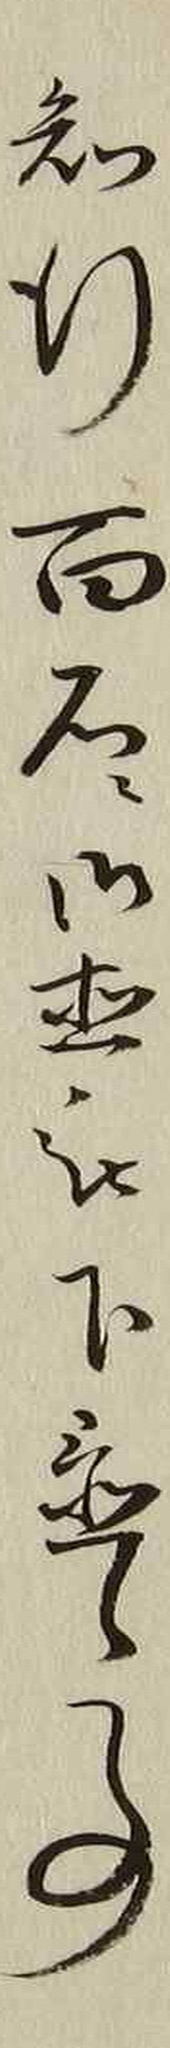知行百石ニ御直被下置候事
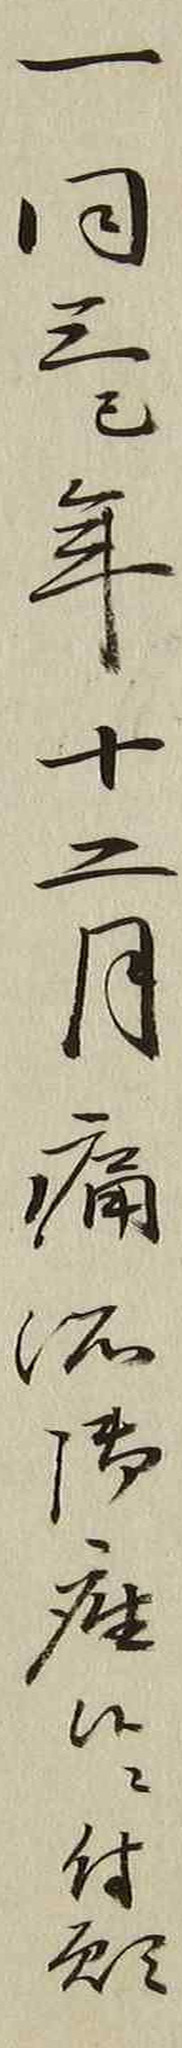一同三巳年十二月痛所御座候ニ付願
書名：諸士系譜　巻之19　い之部19
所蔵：会津若松市立会津図書館
